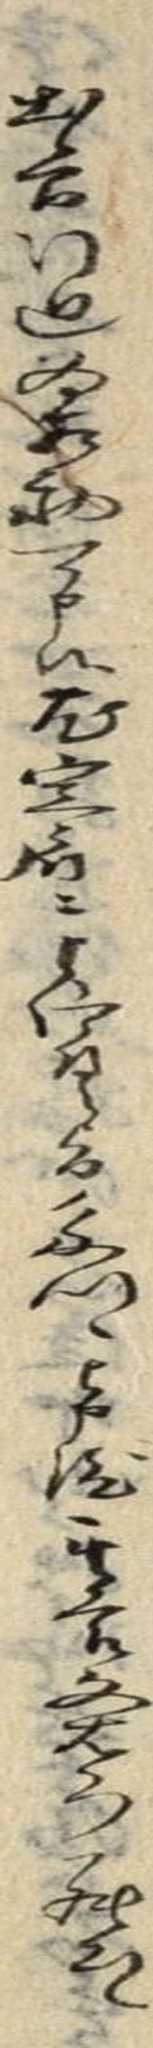出候間引廻為相勤可申候尤定府ニ被仰付候旨多門へ被申渡其節久右衛門罷出候
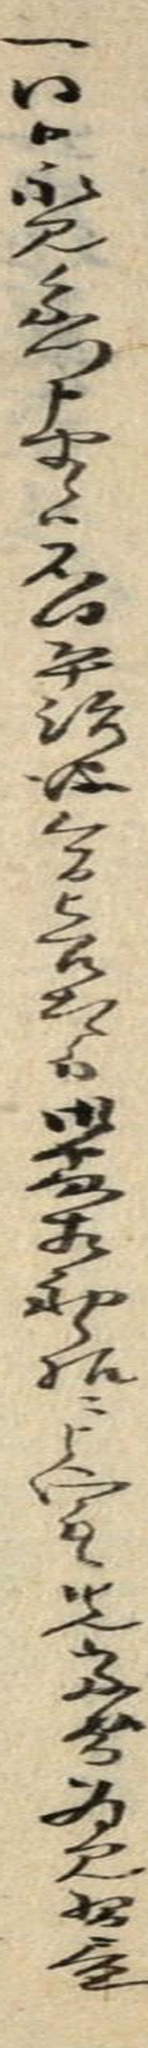一同日永見多門申聞候は石田平治儀今日被召出候に付御番相勤候様に被仰付候先当分為見翌昼
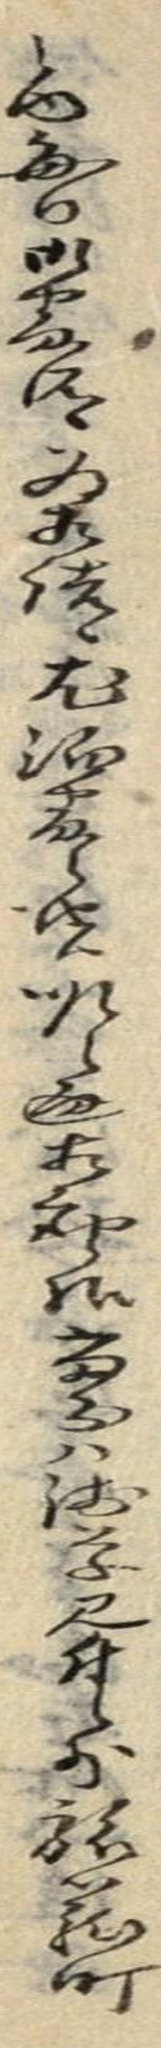之内毎日御番所へ為相詰候尤泊番之儀ハ順之通相勤候様当分ハ浅草見付之外旅篭町
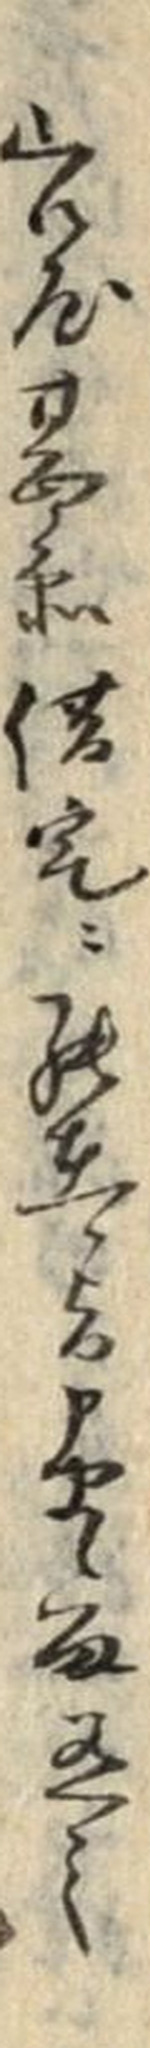山口屋甚兵衛借宅ニ罷在候旨申聞候留有之
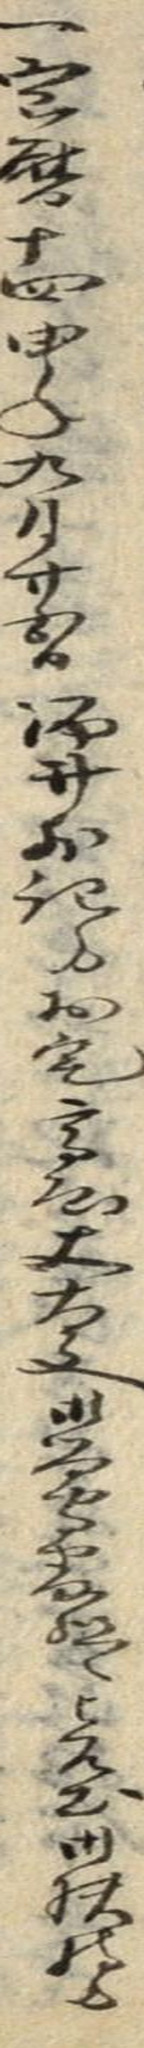一宝暦十四申年九月廿五日酒井外記方於宅高屋丈太夫御留守居組へ被召出御扶持方
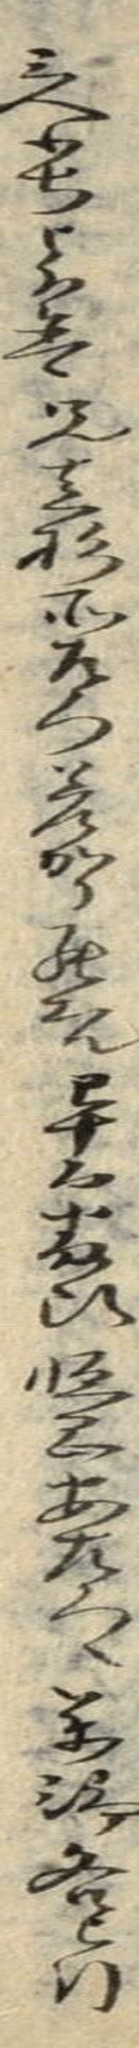三人ふち被下置候兄真杉所左衛門差加り罷出ル畢而番頭恒岡安左衛門へ万端各々被引
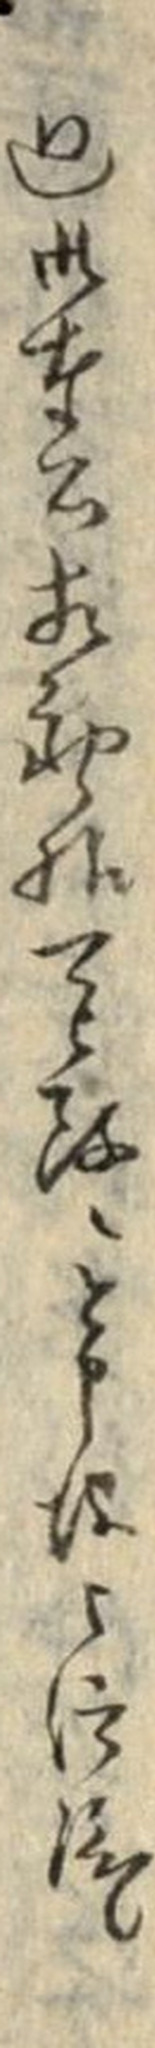廻御奉公相勤候様可被致にと申儀被仰渡候

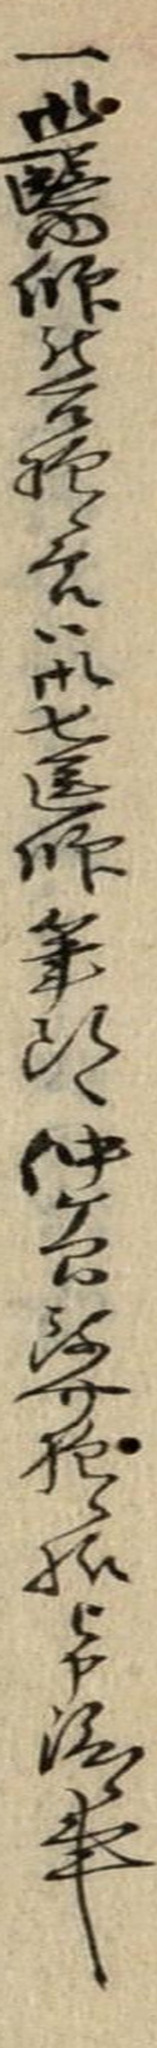一御医師被召抱候節は御匙医師筆頭へ仲ヶ間致介抱候様被申渡候事
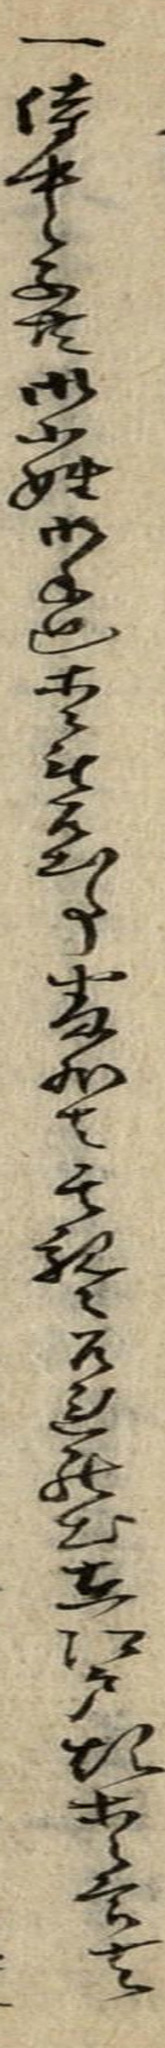一侍中之子共御小姓御手廻等に被召出候事番外は其親々召連罷出在江戸煩等之節は
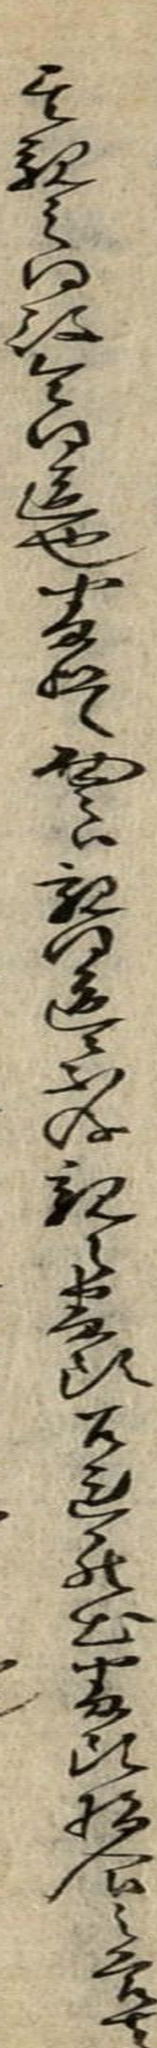其親之同役令同道也番組之面々は親同道に不及親之番頭召連罷出番頭指合之節は
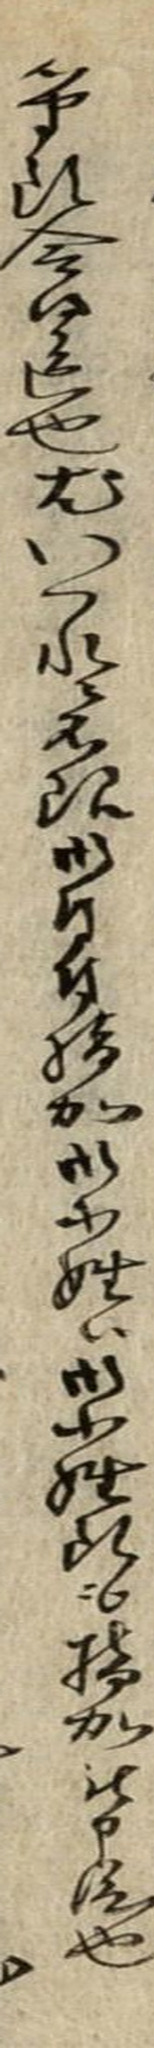筆頭令同道也尤いつれに不限御目付指加御小姓は御小姓頭も指加被申渡也
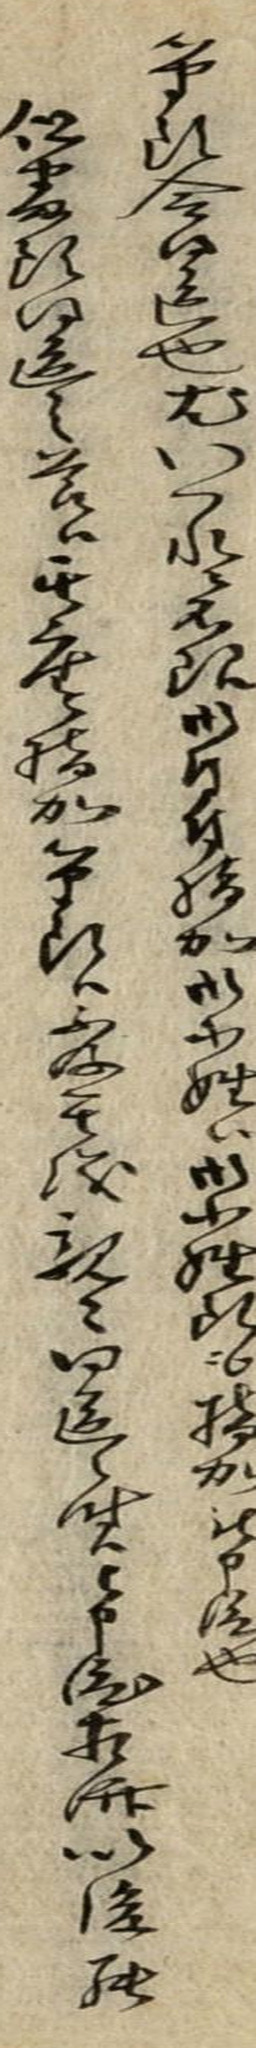但番頭同道之節は其座に指加筆頭は不及其儀親々同道之時は被申渡相済已後罷
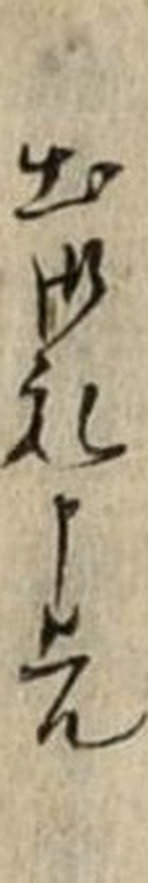出御礼申上ル
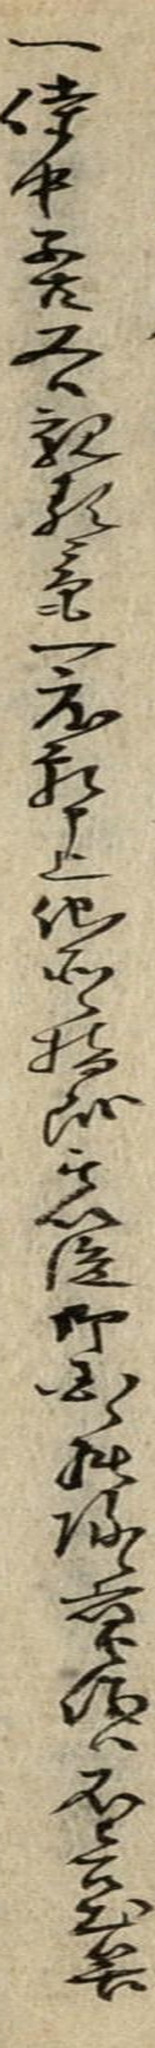一侍中子共又は親類に而も一度願申上他所へ指越其以後御国へ罷帰候者之儀は不被召出筈
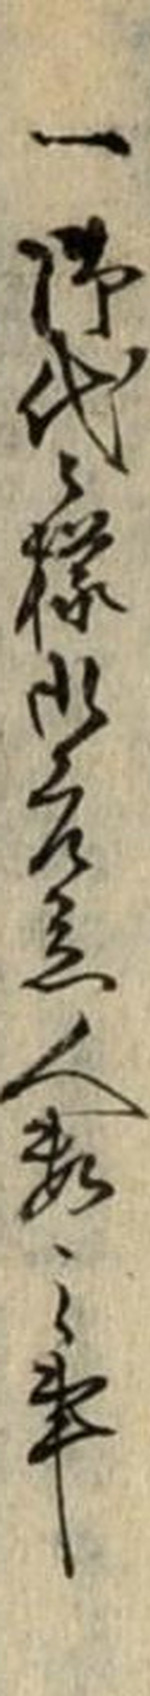一御代々様御取立人数之事
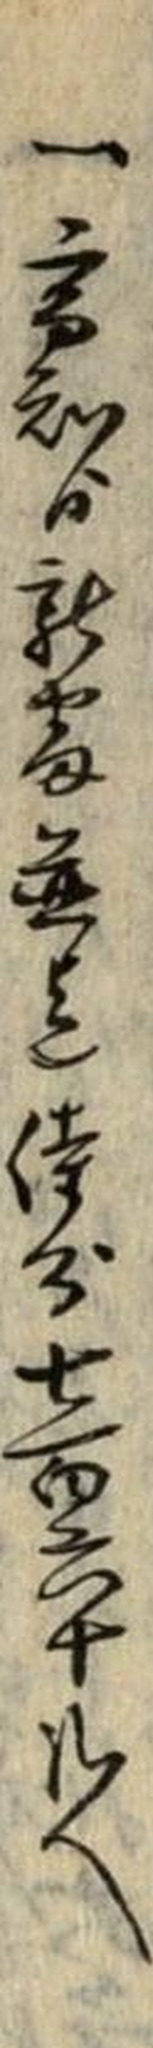一高知ゟ新番並迄侍分七百六十弐人
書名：御用并被仰出之部
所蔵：福井県文書館 Fukui Prefectural Archives
